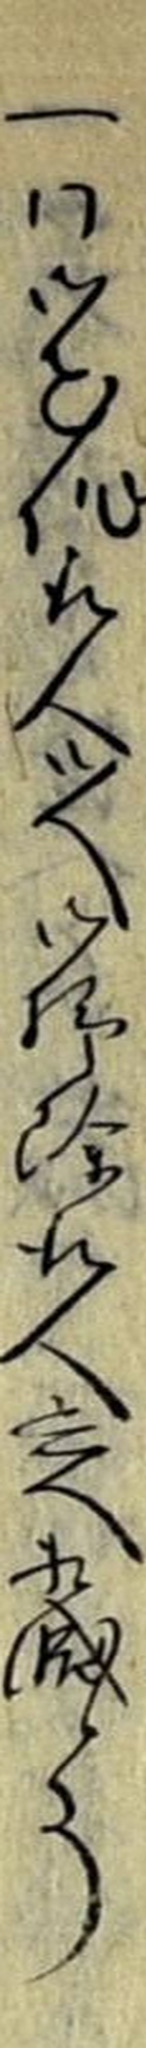一同御花作取人弐人御掃除取人壱人相減候事
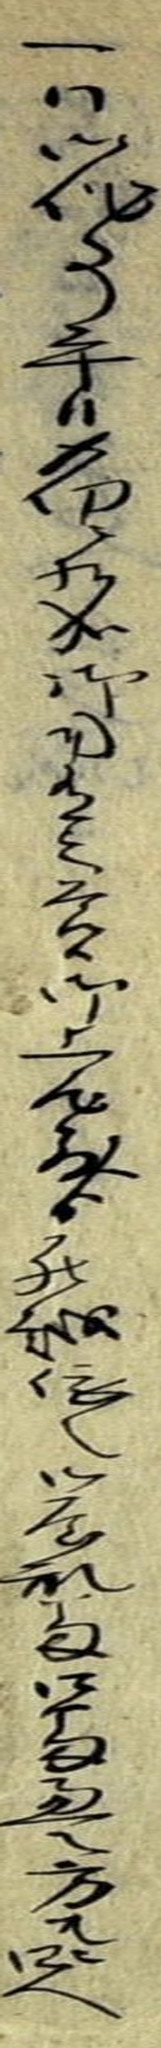一同御作事平日〆切ニ相成御用有之節ハ御上屋敷ゟ罷越依之御屋形番御番畳方共ニ四人
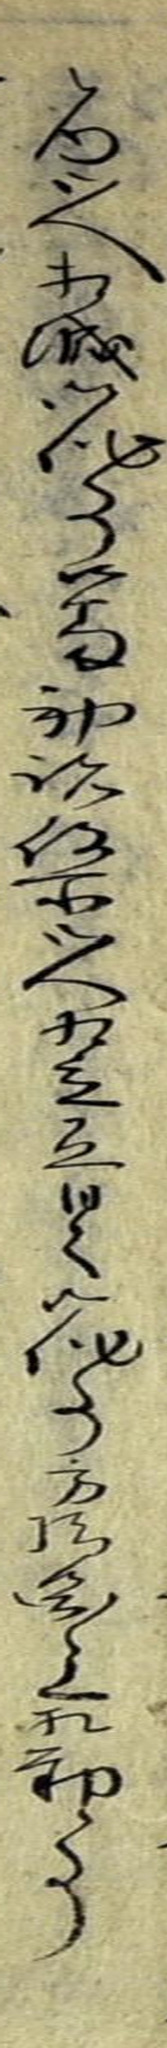之内弐人相減御作事御番初跡役所弐人相立置日々御作事方指図之上相勤候事
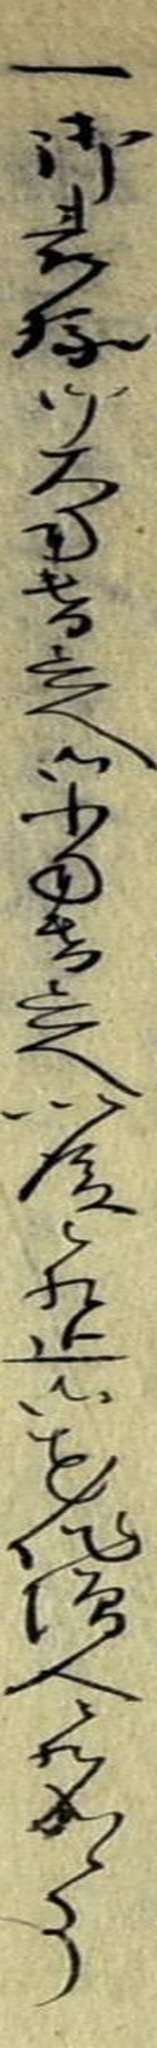一御表様御大用替壱人御小用替壱人以後被相止御花作増人ニ相成候事
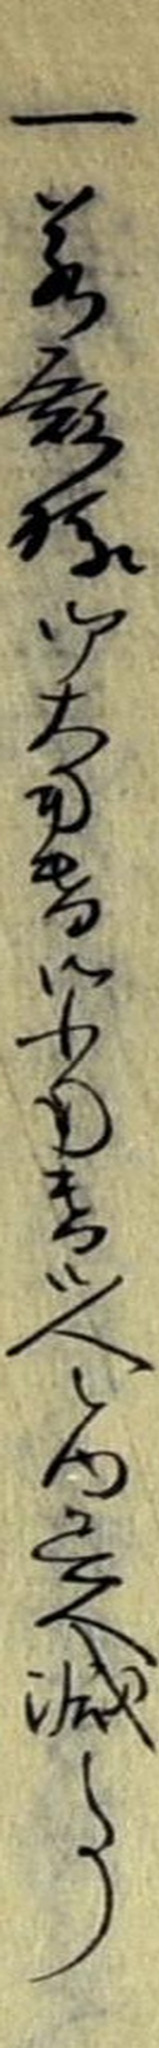一若殿様御大用替御小用替弐人之内壱人減候事
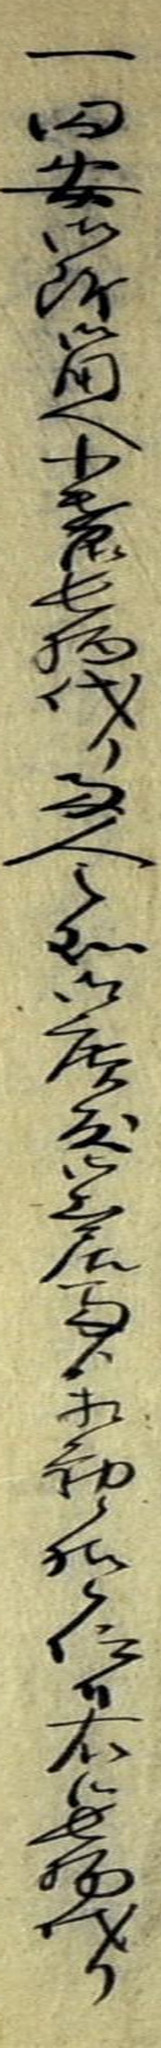一田安御付御用人小遣御長柄代り両人之処御広敷御出居番ゟ相勤候様被仰付右御長柄代り

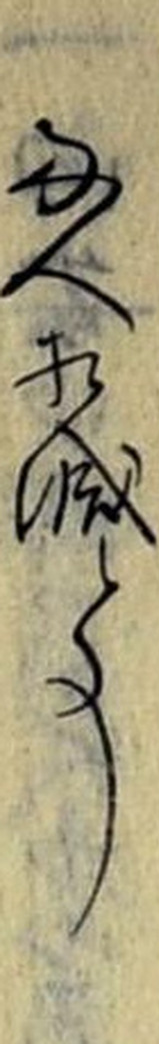両人相減候事
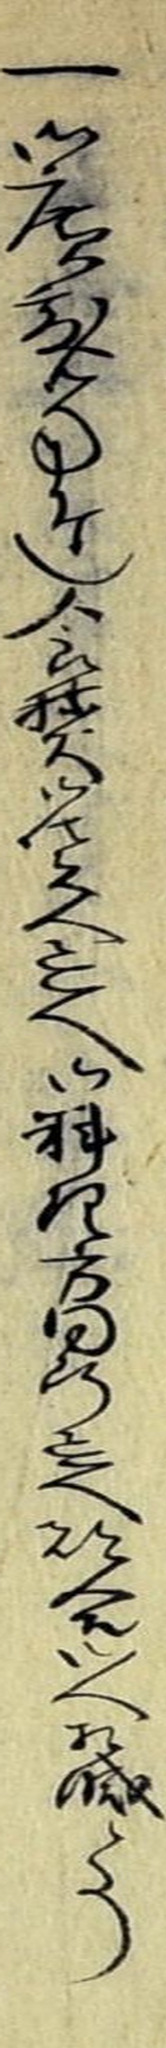一御広敷御用達食焚御貸人壱人御料理方同断壱人都合弐人相減候事
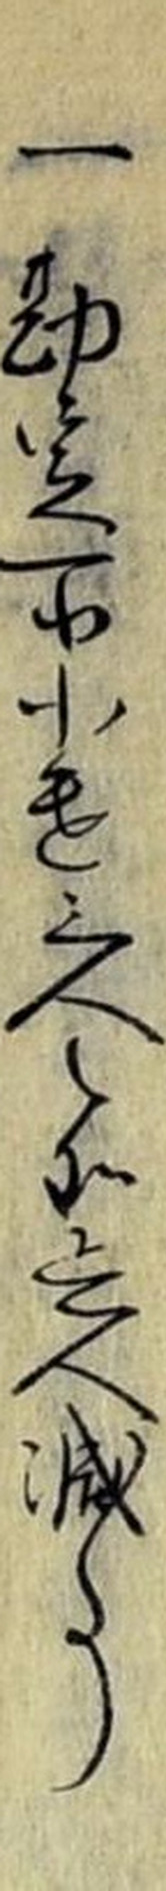一勘定所小遣三人之処壱人減候事
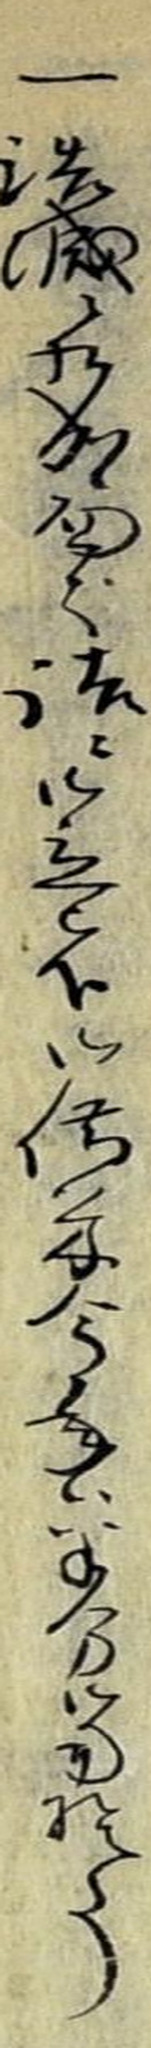一詰減ニ相成候面々へ詰ニ御立被下御借米今年ハ半分御用捨候事
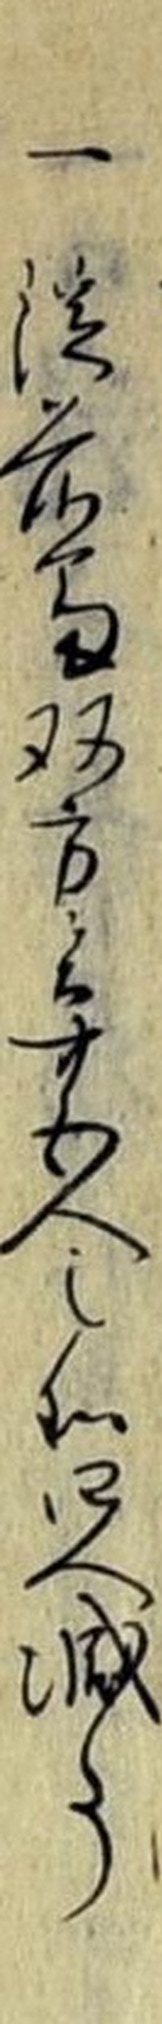一錠前番双方ニ而廿五人之処四人減候事
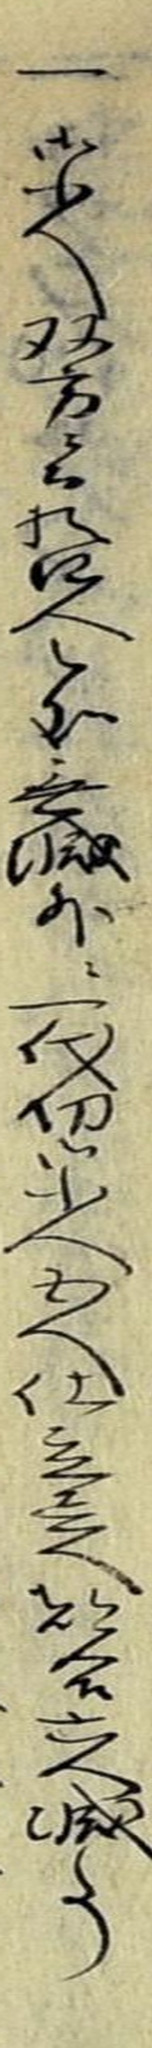一御小人双方ニ而拾四人之処無減外ニ一代切御小人五人仕立壱人都合六人減候事
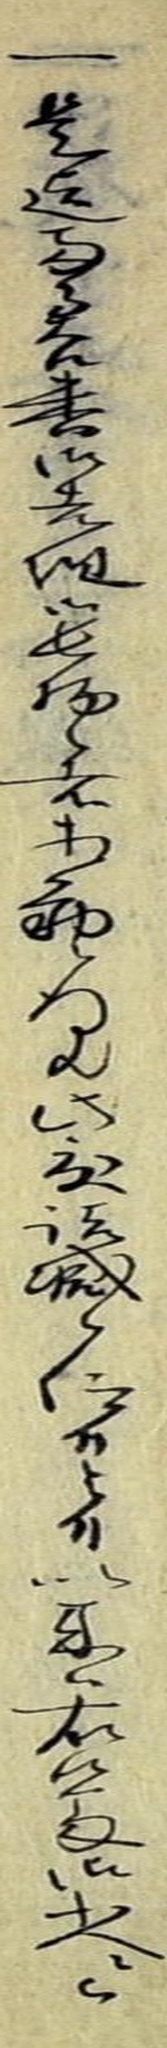一是迄両奥御番御先組御長柄之者相勤候得共此度詰減被仰付候ニ付以来ハ右御番御小人ニ被
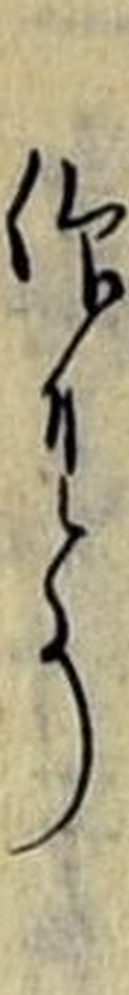仰付候事
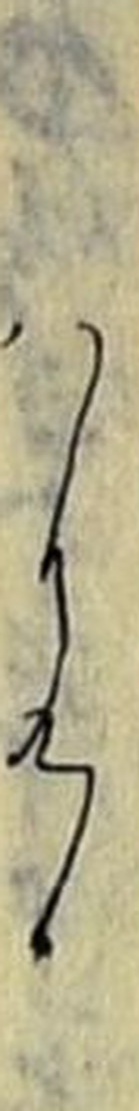八月九日
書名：命令之部 三
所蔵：福井県文書館 Fukui Prefectural Archives
